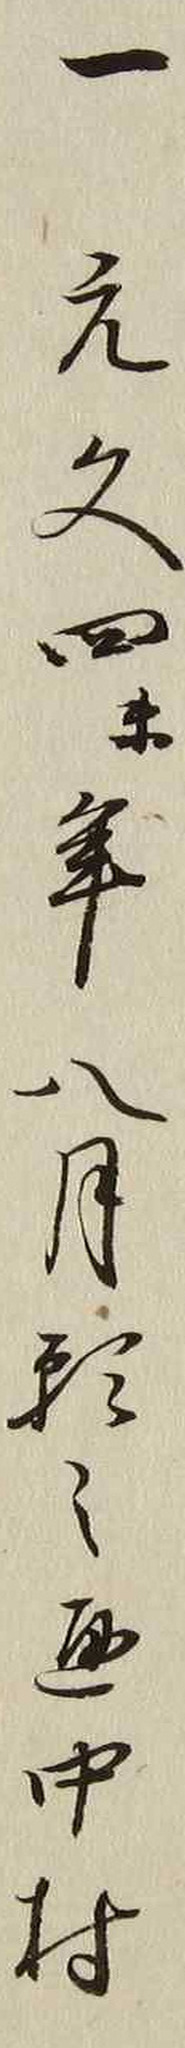一元文四未年八月願之通中村
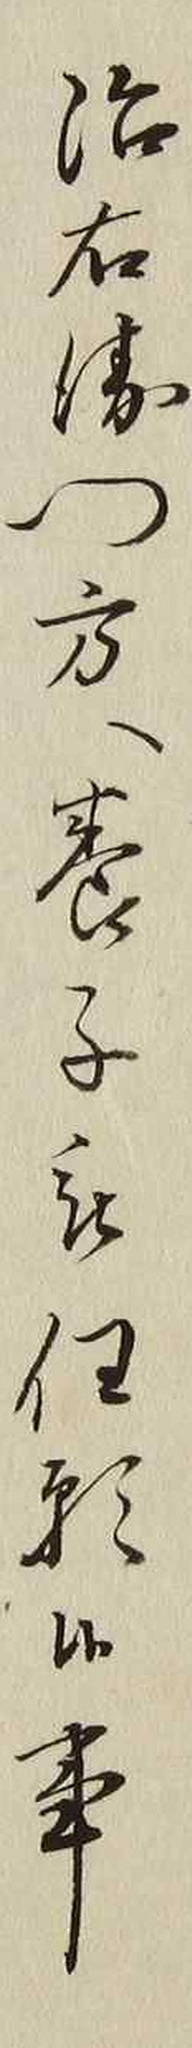治右衛門方へ養子被任願候事
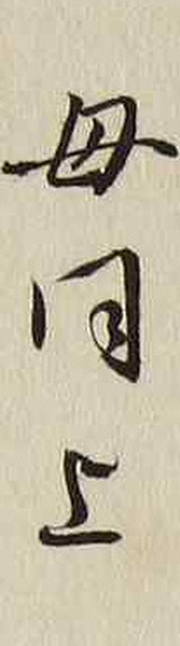母同上
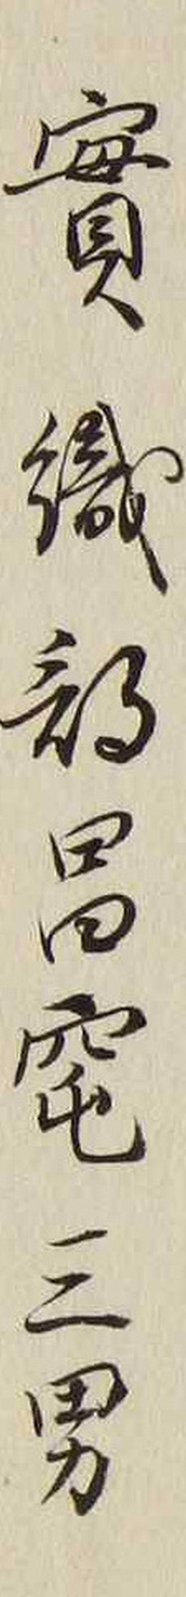実織部昌窀三男

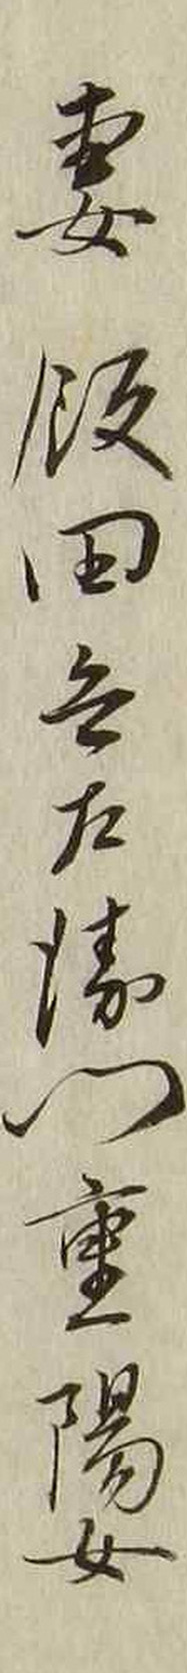妻飯田兵左衛門重陽女
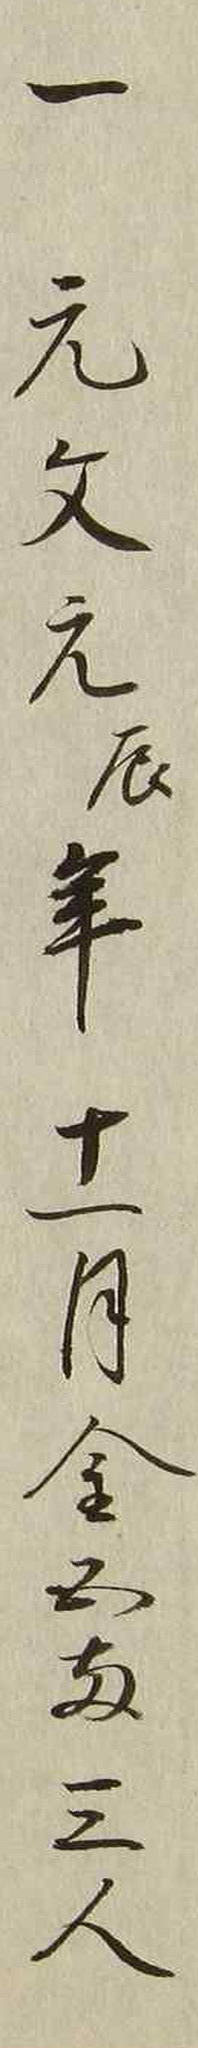一元文元辰年十一月金五両三人
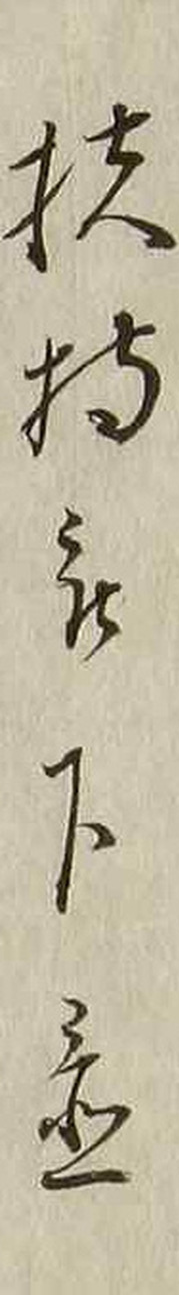扶持被下置
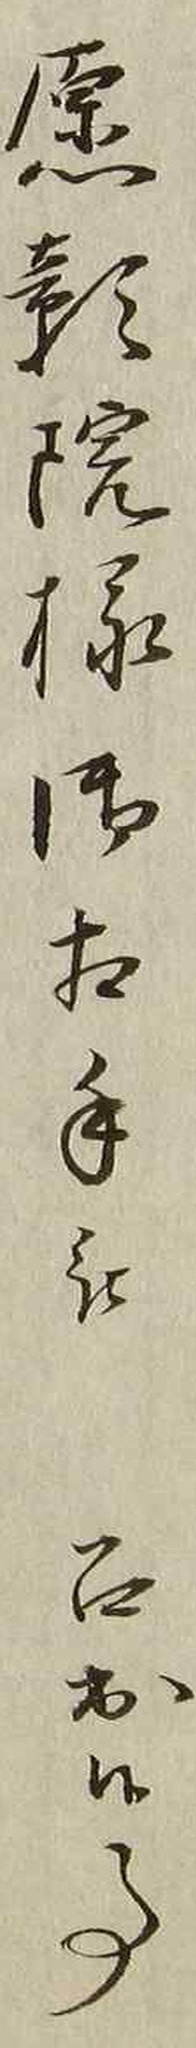愿影院様御相手被召出候事
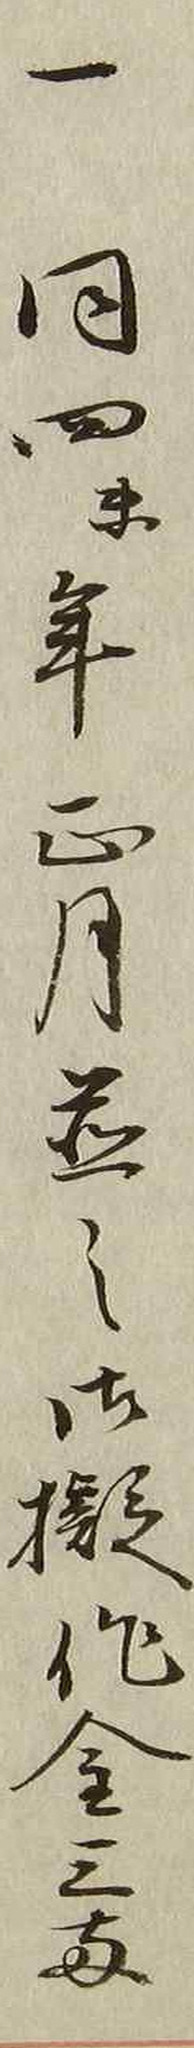一同四末年正月並之御擬作金三両
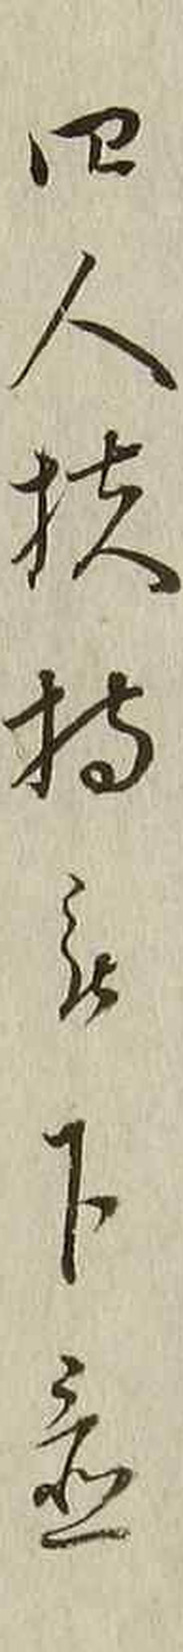四人扶持被下置
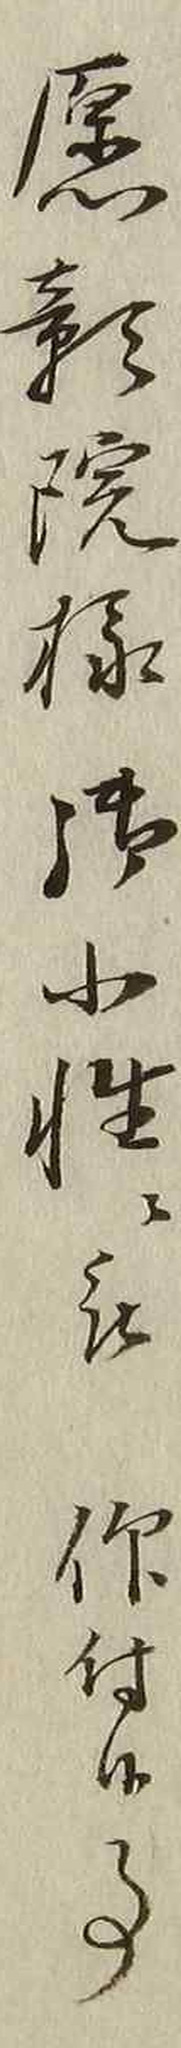愿影院様御小性ニ被仰付候事
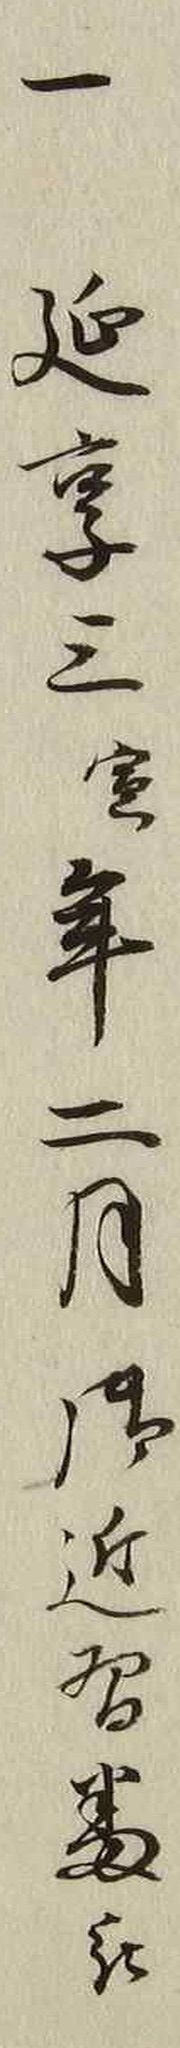一延享三寅年二月御近習番被
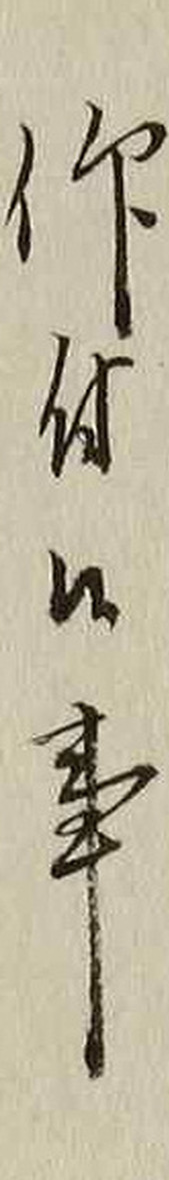仰付候事
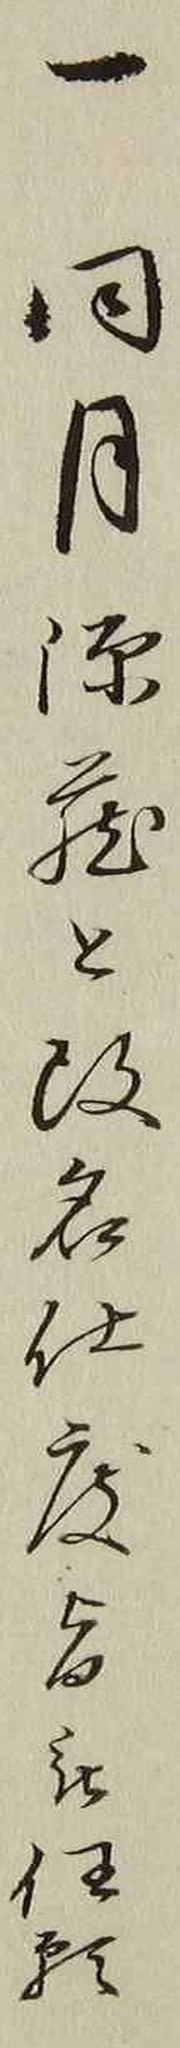一同月源蔵と改名仕度旨被任願
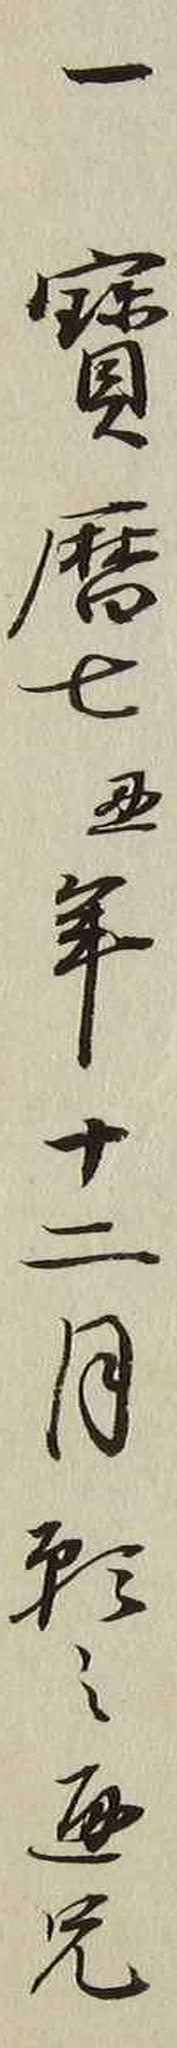一宝暦七丑年十二月願之通兄
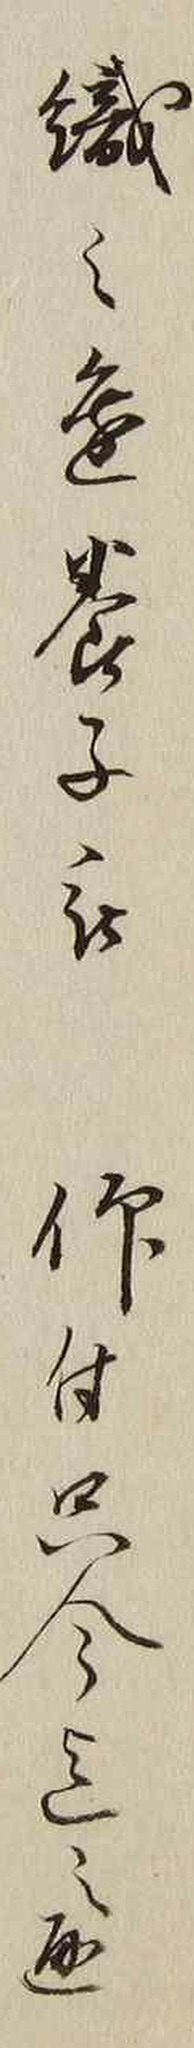織之進養子被仰付只今迄之通
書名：諸士系譜　巻之22　い之部22
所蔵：会津若松市立会津図書館
